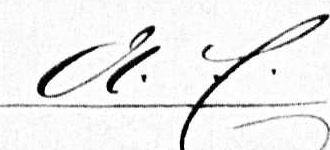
A. E.
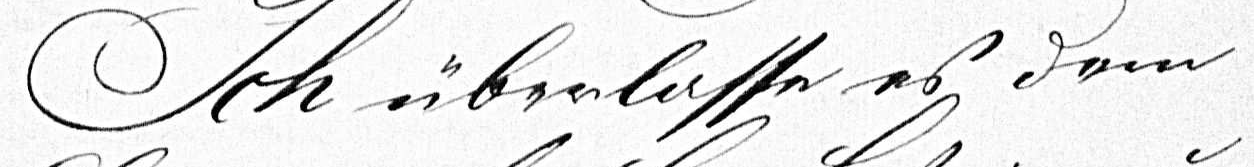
Jch überlasse es dem
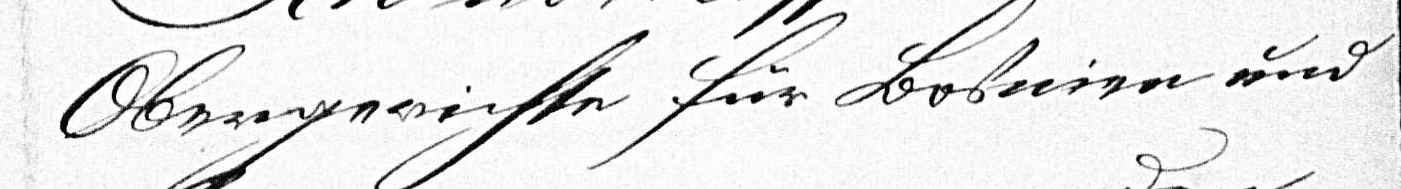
Obergerichte für Bosnien und
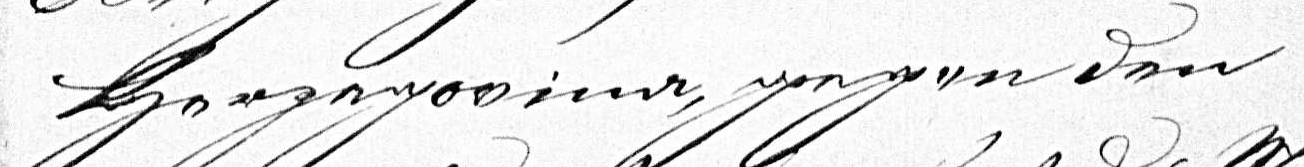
Herzegovina, gegen den
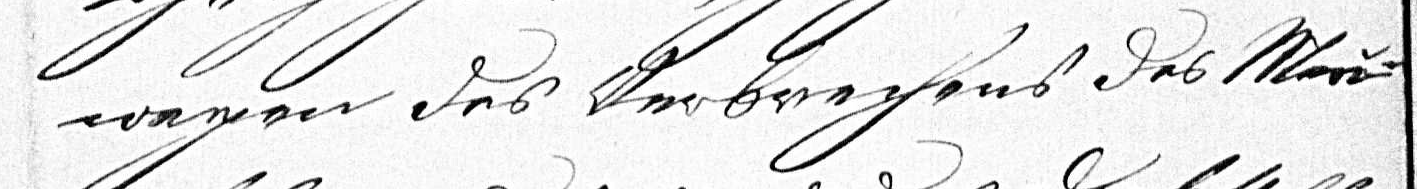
wegen des Verbrechens des Meu¬
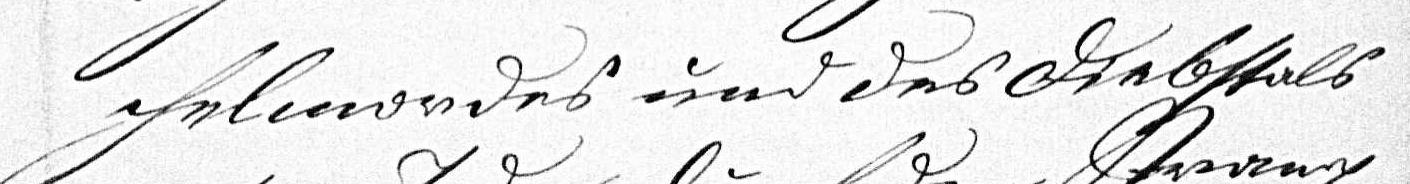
chelmordes und des Diebstals
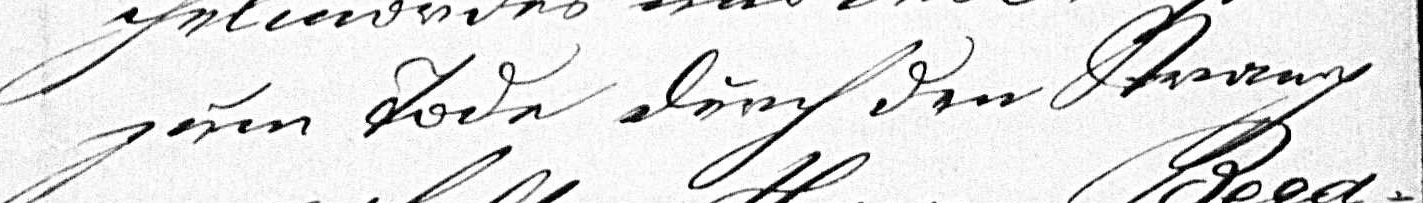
zum Tode durch den Strang
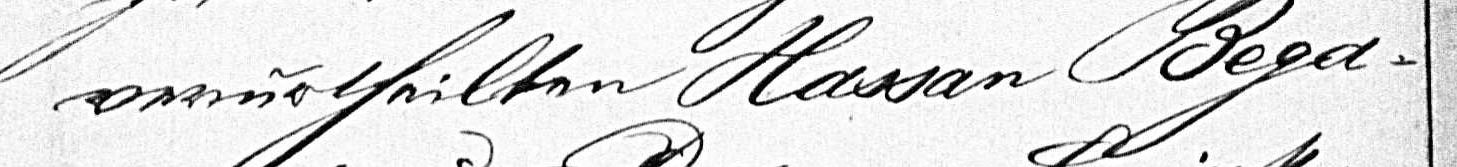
verurtheilten Hassan Bega¬
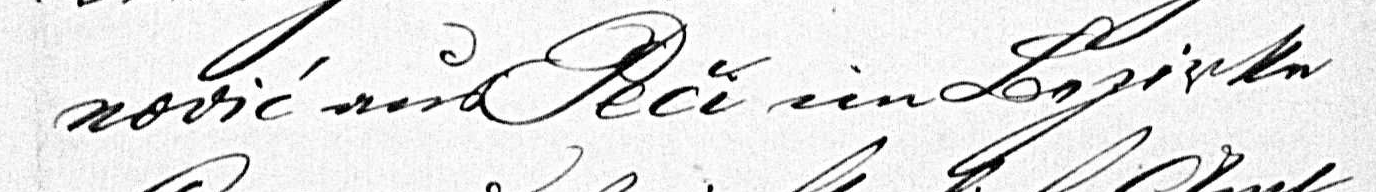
nović und Peči im Bezirke
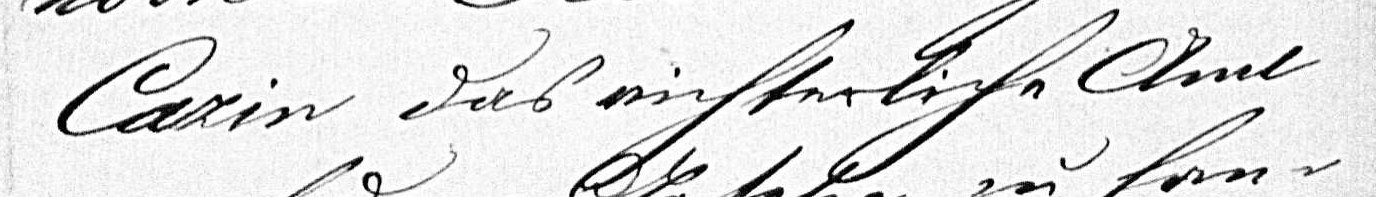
Cazin das richterliche Amt
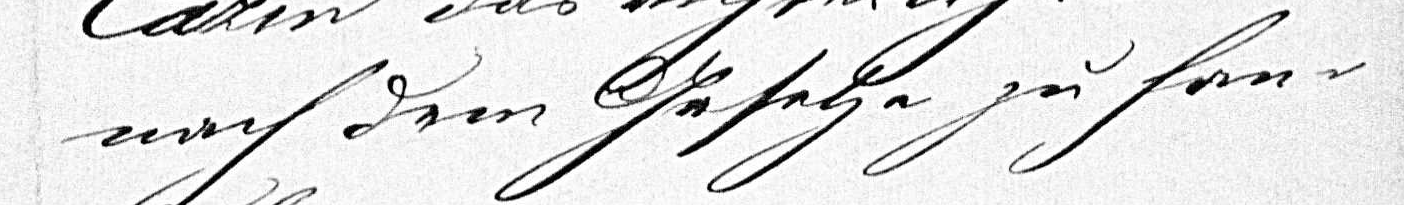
nach dem Gesetze zu han¬
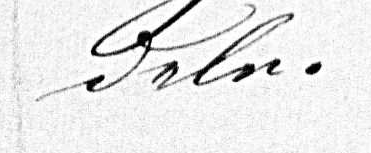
deln.
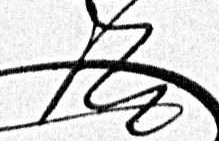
xx
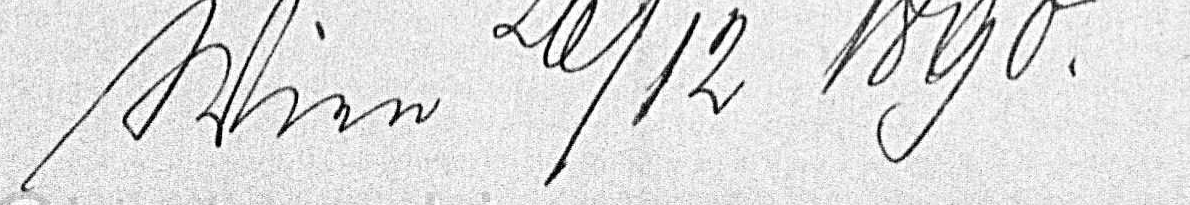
Wien 26/12 1890.
